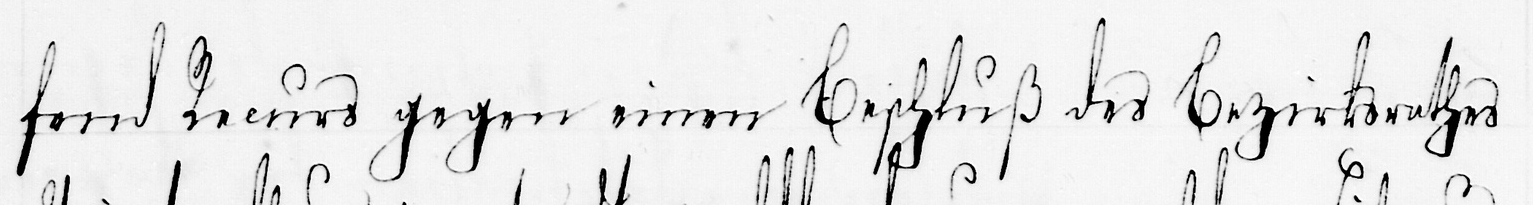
fend Recurs gegen einen Beschluß des Bezirksrathes
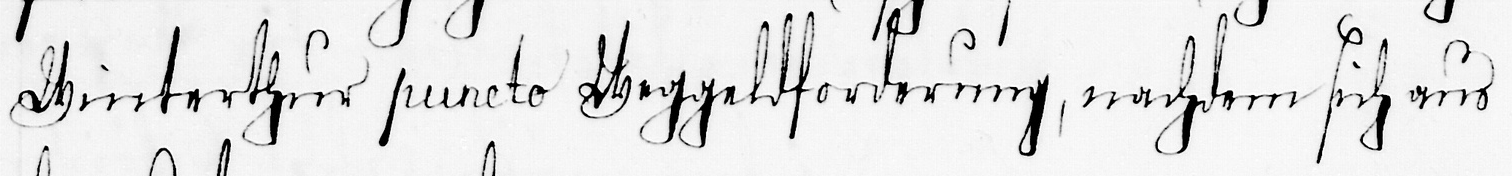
Winterthur puncto Weggeldforderung, nachdem sich aus
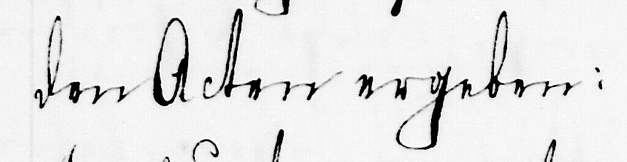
den Acten ergeben:
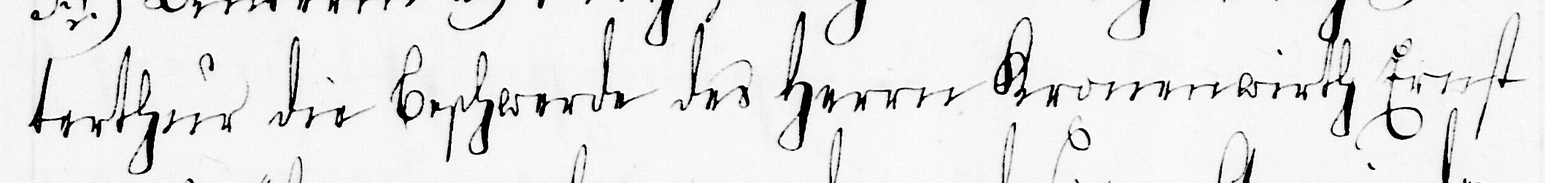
terthur die Beschwerde des Herrn Kronenwirth Ernst
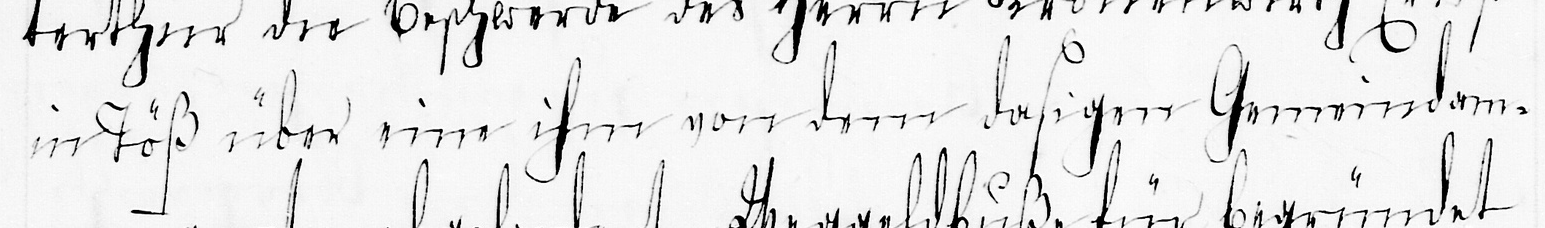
in Töß über eine ihm von dem dasigen Gemeindam¬
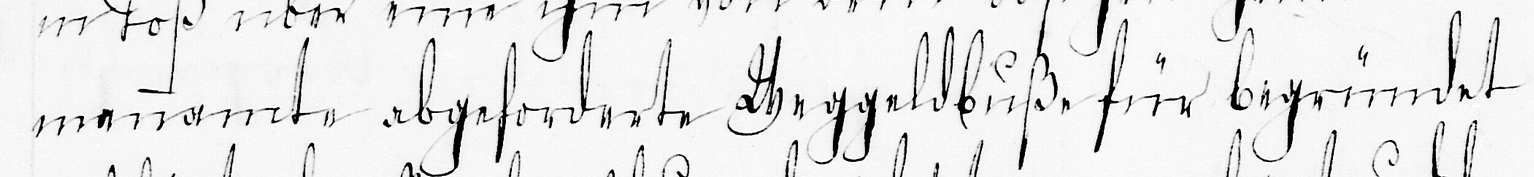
mannamte abgeforderte Weggeldbuße für begründet
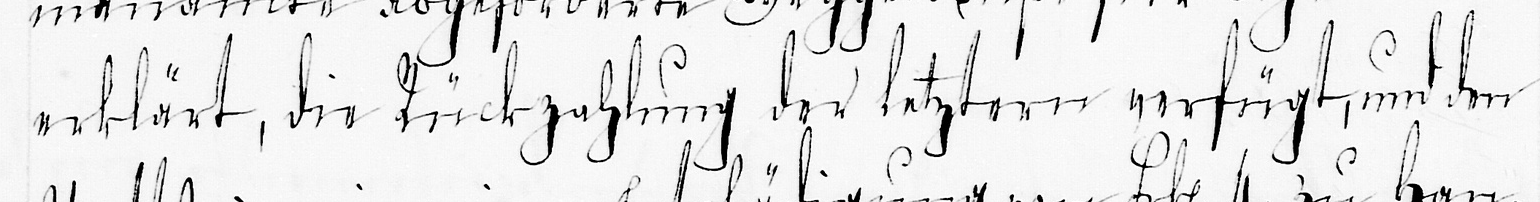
erklärt, die Rückzahlung der letztern verfügt, und dem
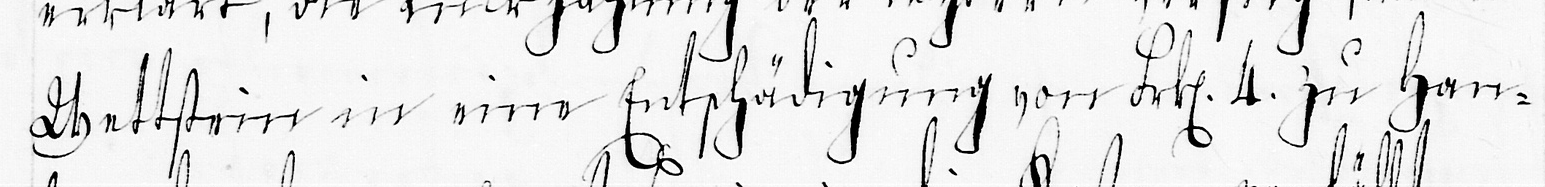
Wettstein in eine Entschädigung von Frk[en]. 4. zu Han¬
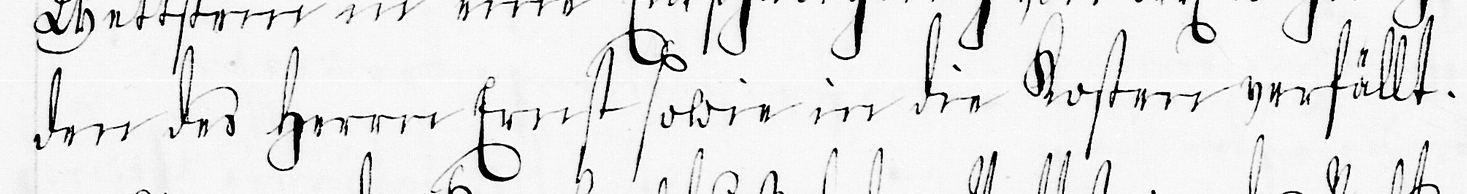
den des Herrn Ernst sowie in die Kosten verfällt.
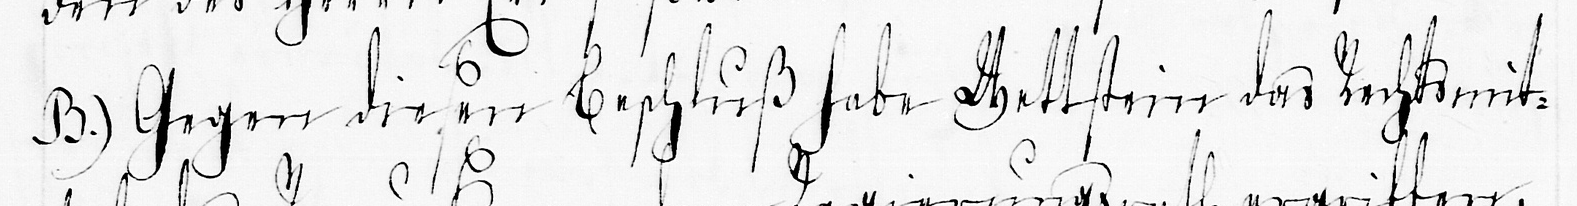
B.) Gegen diesen Beschluß habe Wettstein das Rechtsmit¬
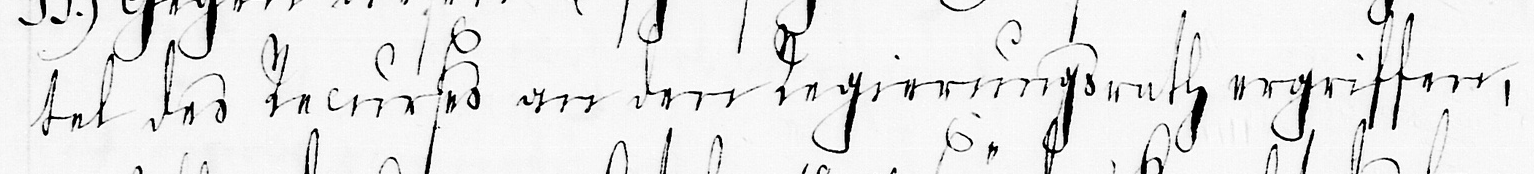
tel des Recurses an den Regierungsrath ergriffen,
